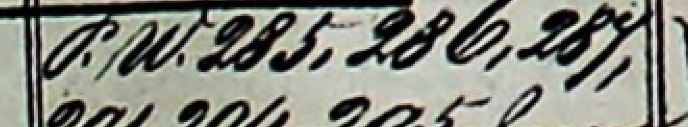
P.W. 285, 286. 289,
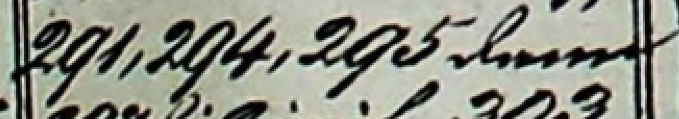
291, 294, 295 dann
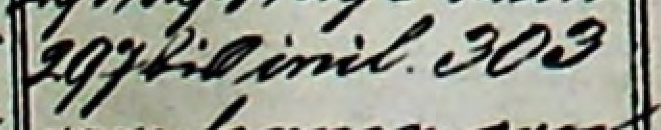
297 bis inil. 303
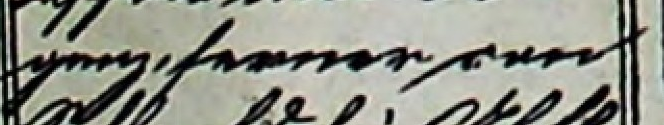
ganz, ferner von
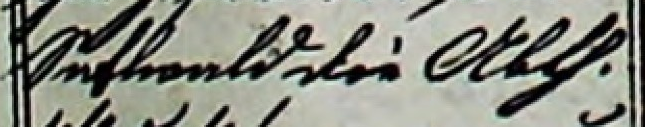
Satlwald die Abth.
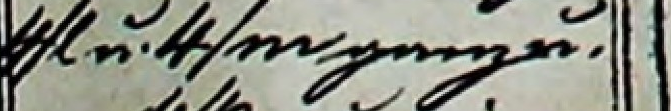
4/l u. 4/m ganz u.
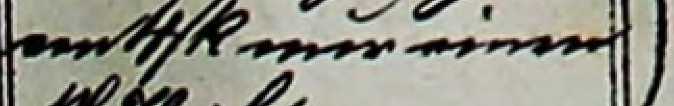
am 4/k nur einer
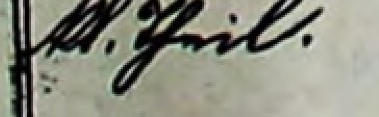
kl. Theil.
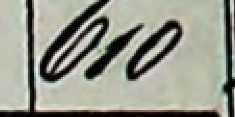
60
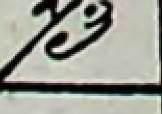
73
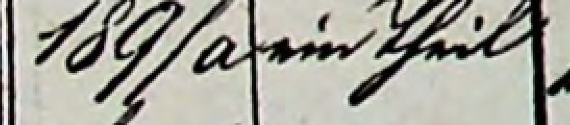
189/a ein Theil
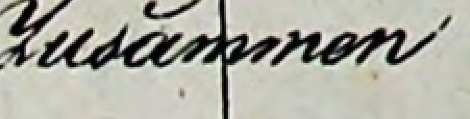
Zusammen
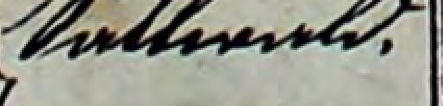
Satlwald.
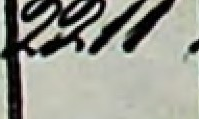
2211
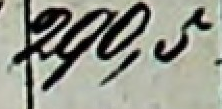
290,5
